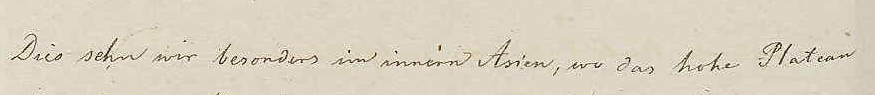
Dies sehn wir besonders im innern Asien, wo das hohe Plateau
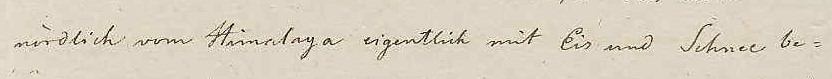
nördlich vom Himalaya eigentlich mit Eis und Schnee be-
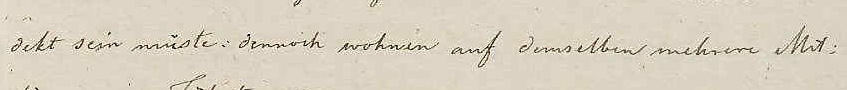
dekt sein müste: dennoch wohnen auf demselben mehrere Mil-
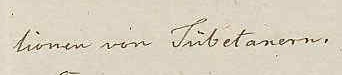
lionen von Tübetanern.
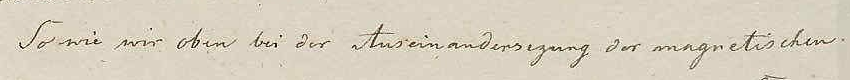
So wie wir oben bei der Auseinandersezung der magnetischen
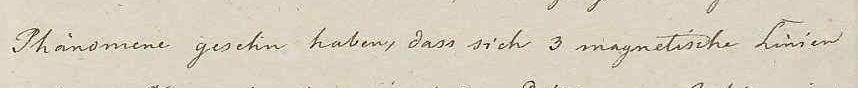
Phänomene gesehn haben, dass sich 3 magnetische Linien
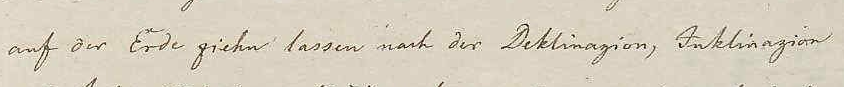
auf der Erde ziehn lassen nach der Deklinazion, Inklinazion
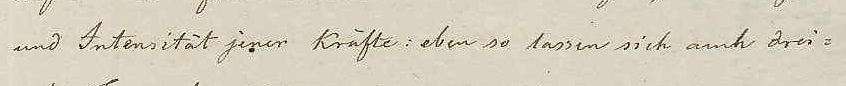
und Intensität jener Kräfte: eben so lassen sich auch drei-
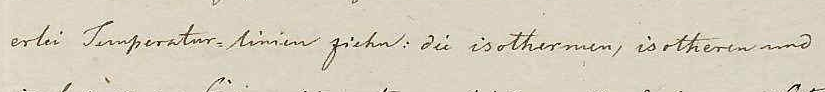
erlei Temperatur-linien ziehn: die isothermen, isotheren und
